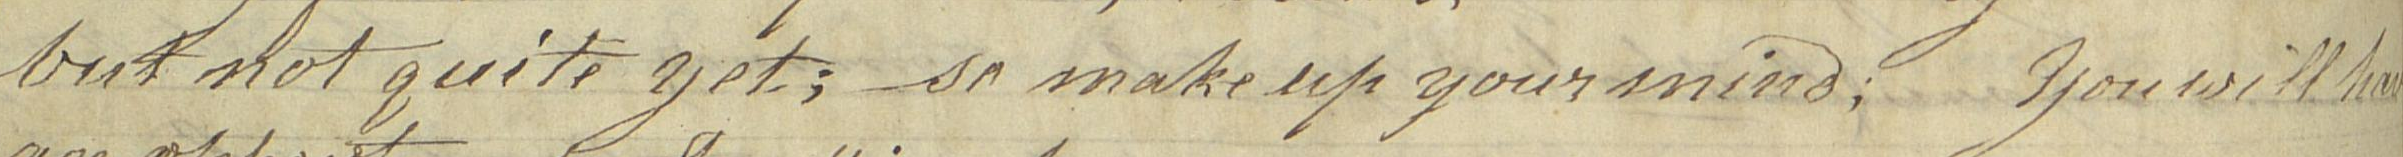but not quite yet; so make up your mind. You will hav-
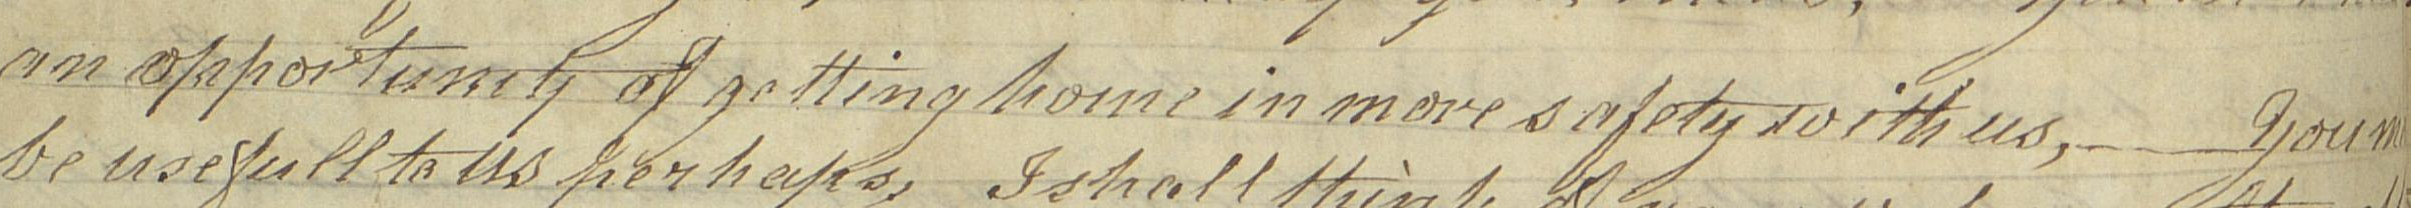an opportunity of getting home in more safety with us, You m-
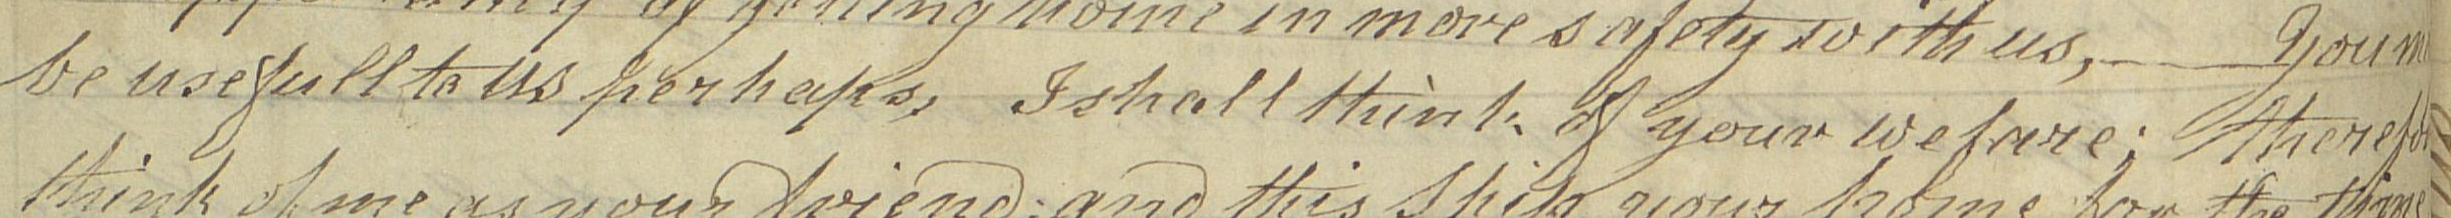be usefull to us perhaps, I shall think Of your wefare; therefo-
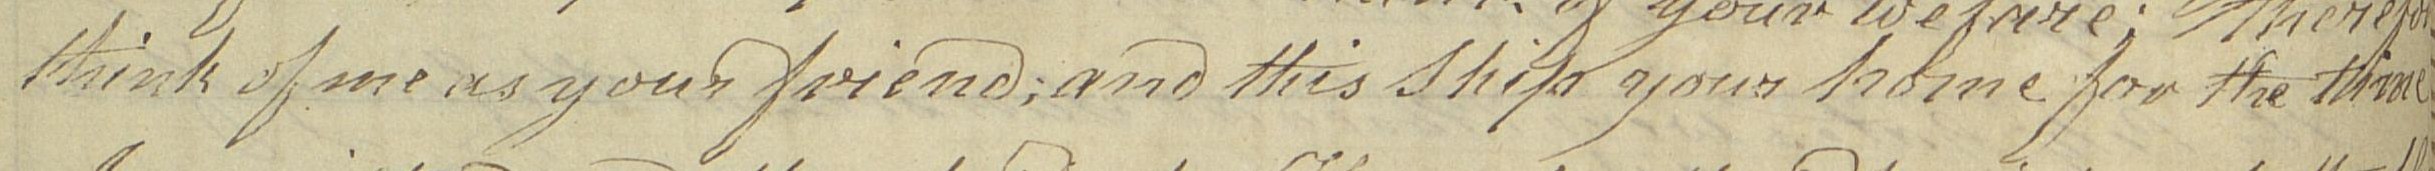think of me as your friend; and this ship your home for the time
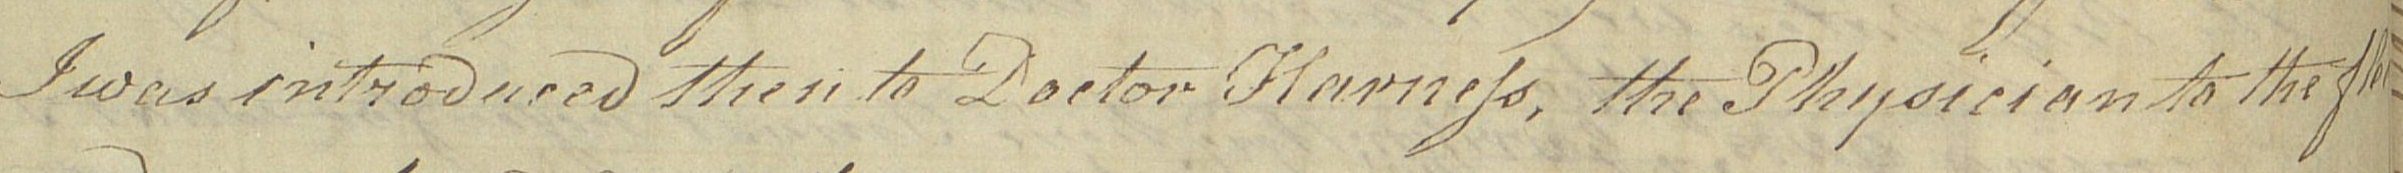I was introduced then to Doctor Harness, the Physician to the fle-
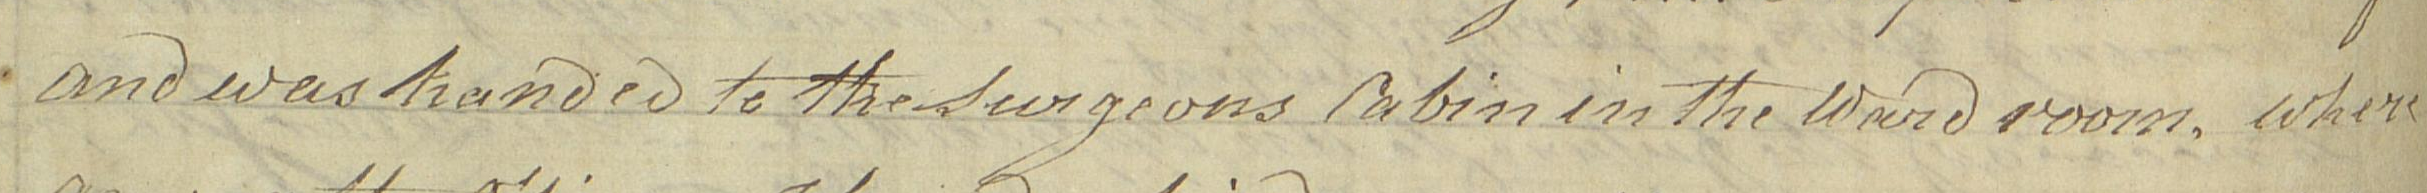and was handed to the Surgeons Cabin in the Ward room, where
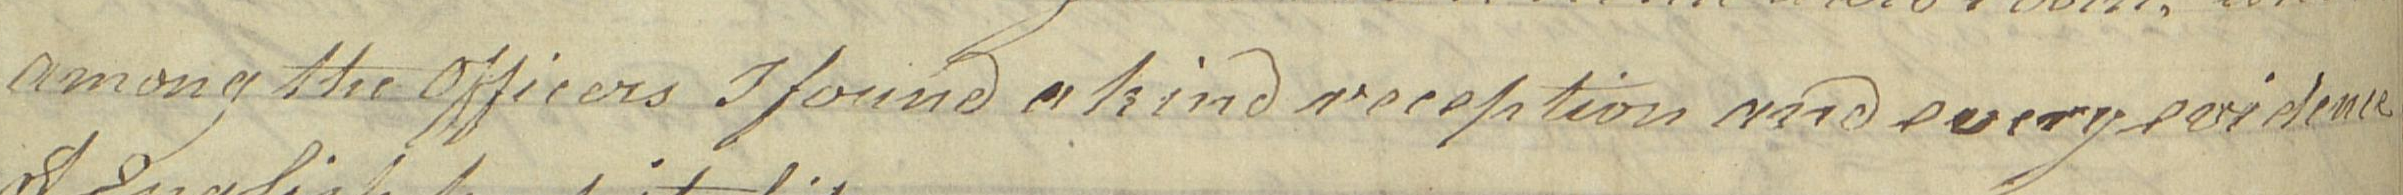among the Officers I found a kind reception and every evidence
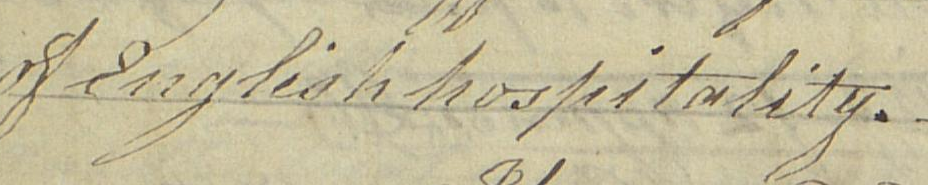of English hospitality.
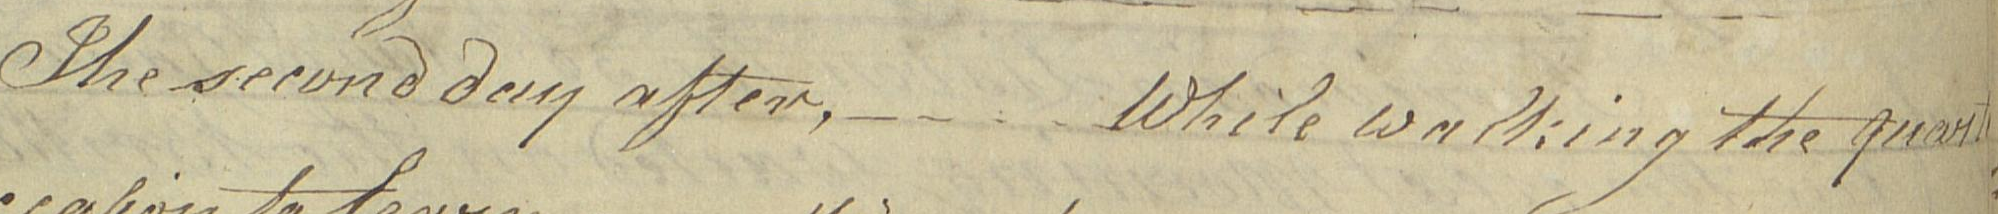The second day after, While walling the quart-
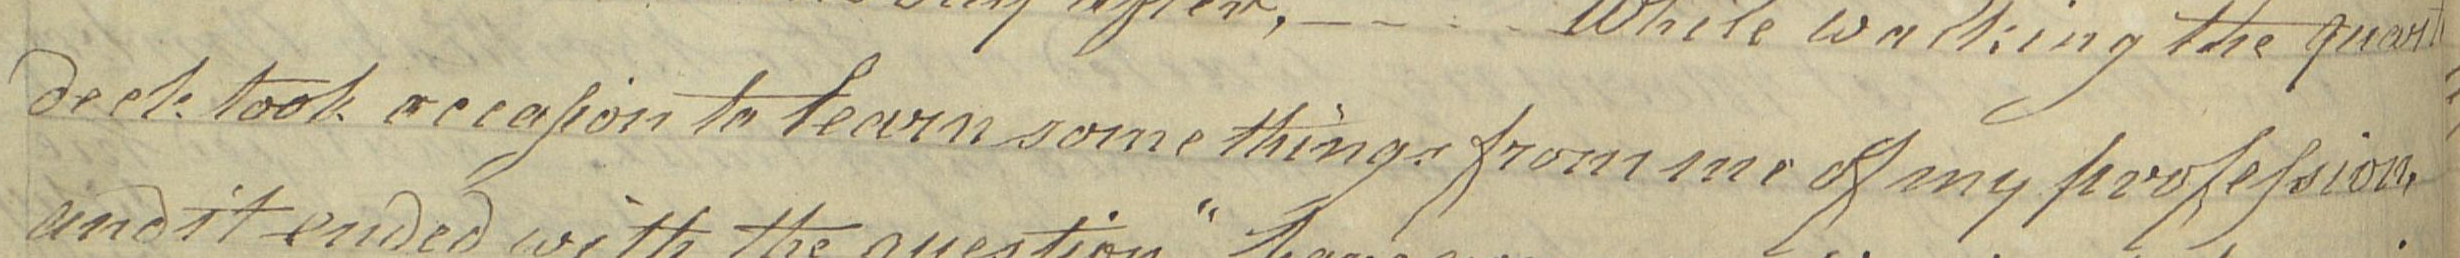deck took occasion to learn some thing from me of my profession,
